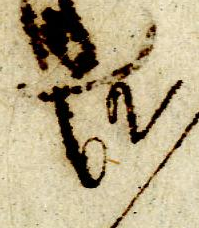62
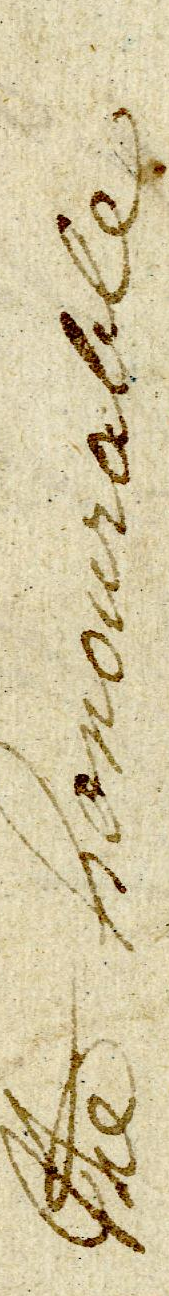The Honourable
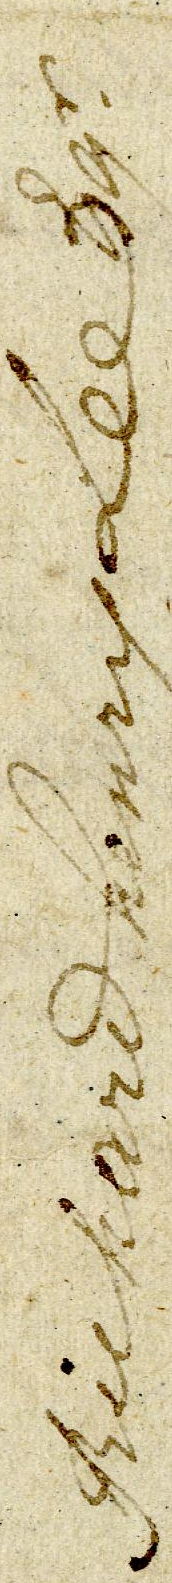Richard Henry Lee Esq^r
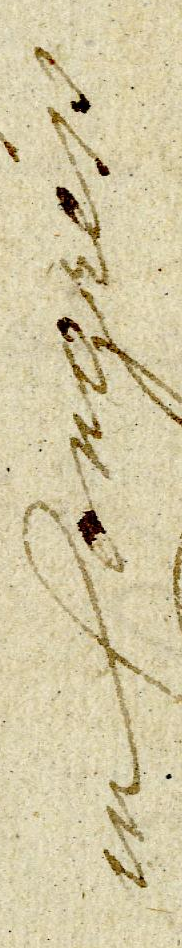in Congress
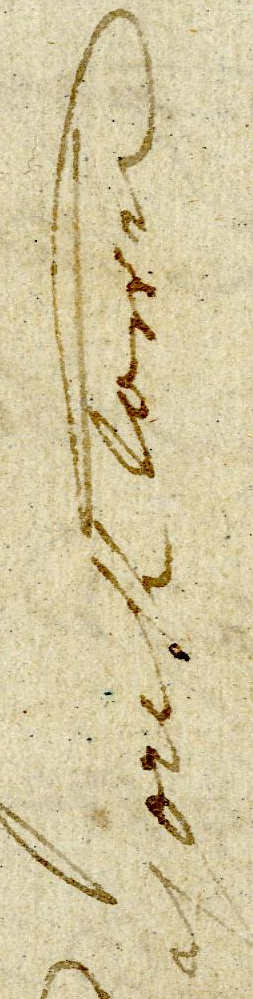york Town
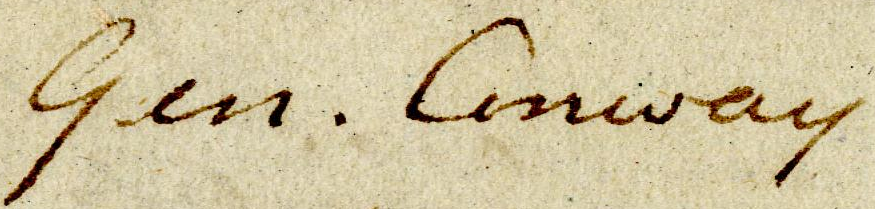Gen. Conway
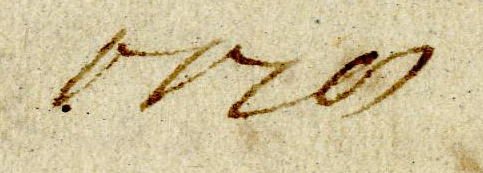1778
